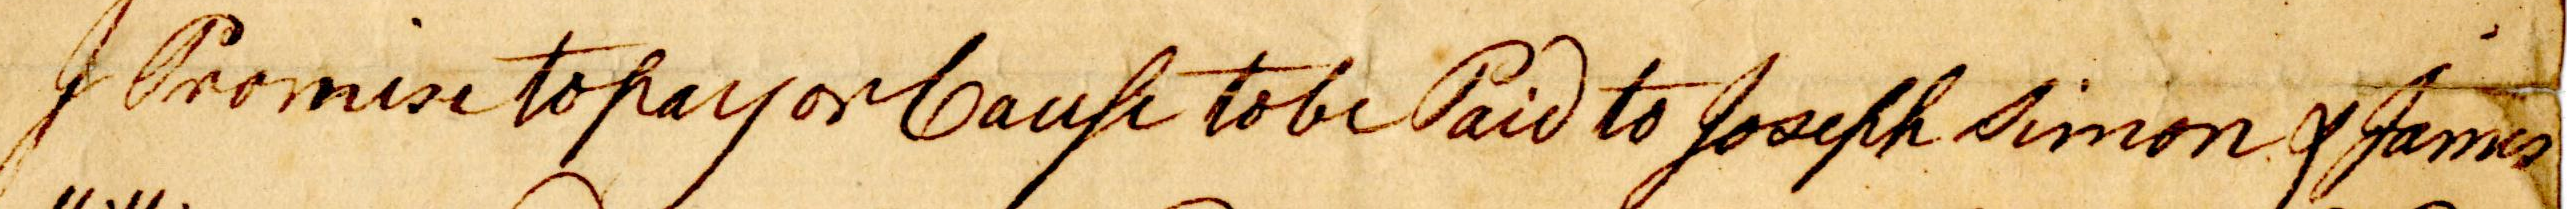I Promise to pay or cause to be paid to Joseph Simon & James
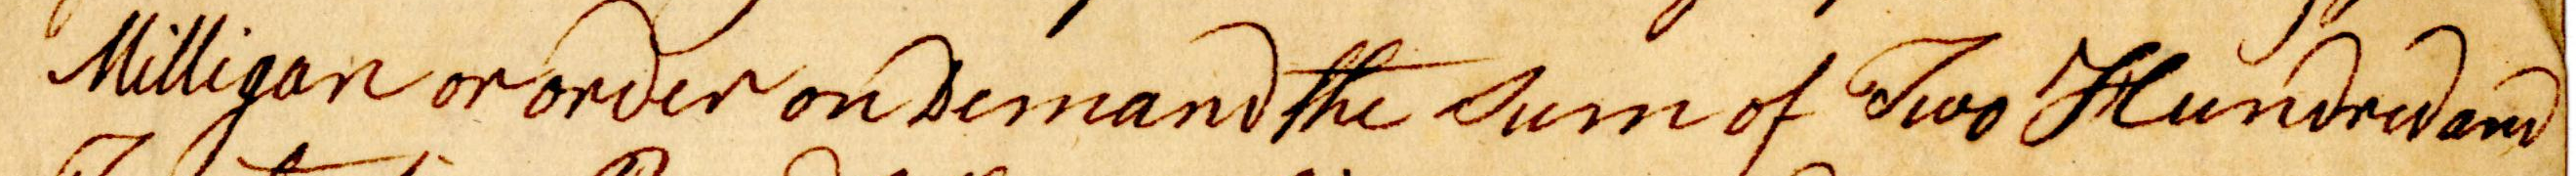Milligan or order on demand the sum of Two Hundred and
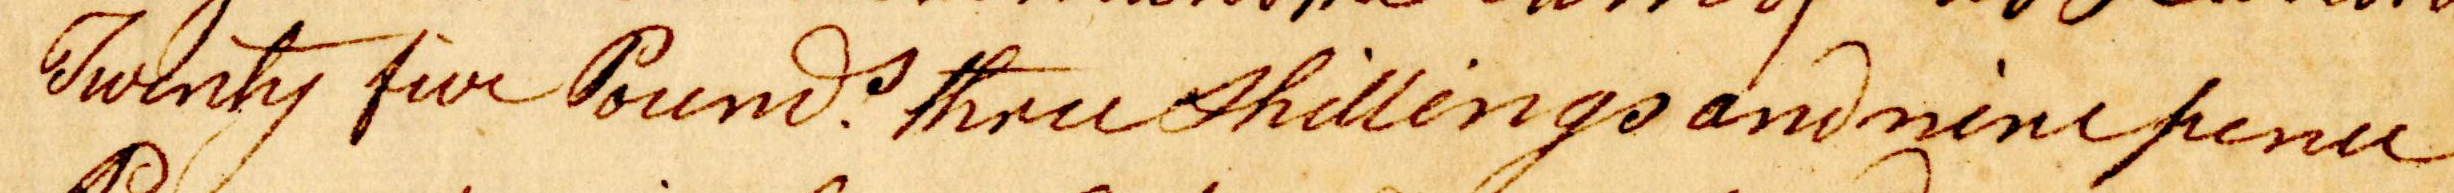Twenty five Pound^s. three shillings and nine pence
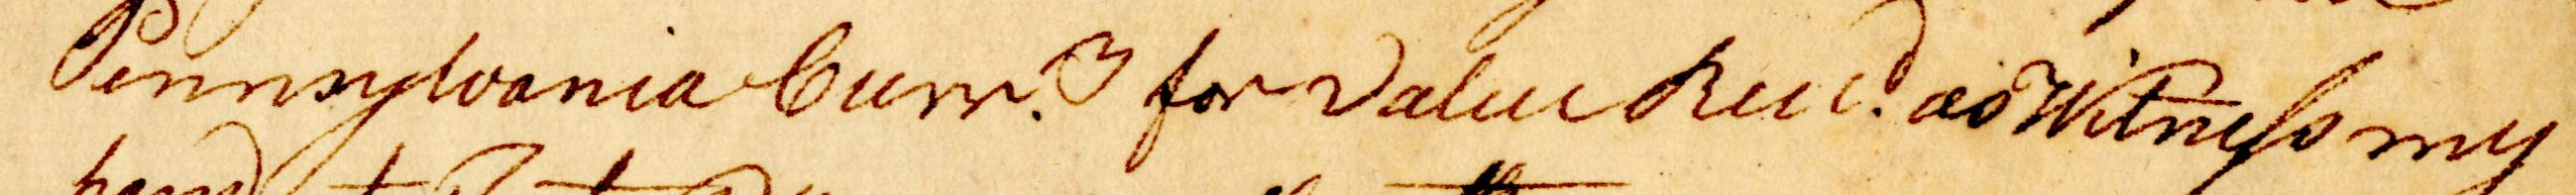Pennsylvania Curr^y. for Value Recc^d. as Witness my
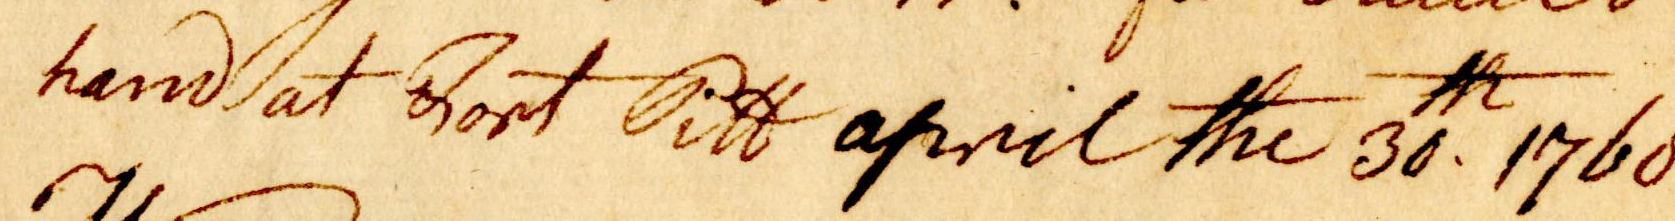hend at Fort Pitt april the 30^th 1768
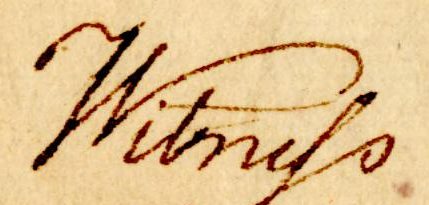Witness
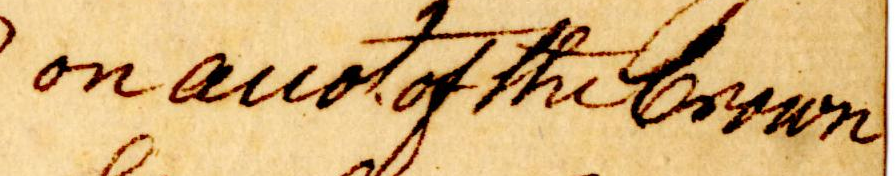on accot. of the Crown
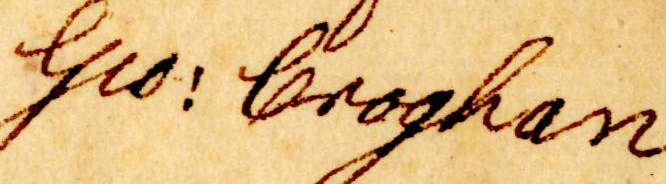Geo. Croghan
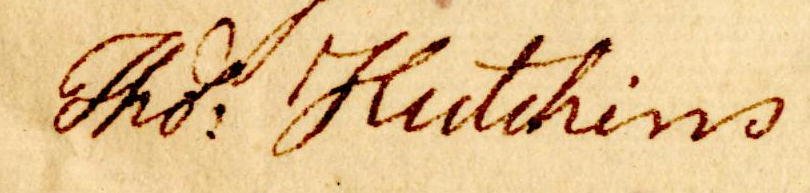Tho. Hutchins
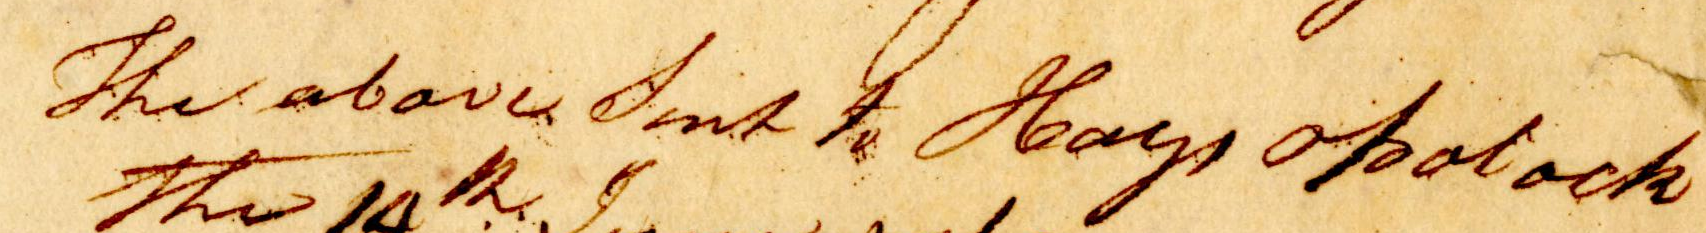The above sent to Harry Obolack
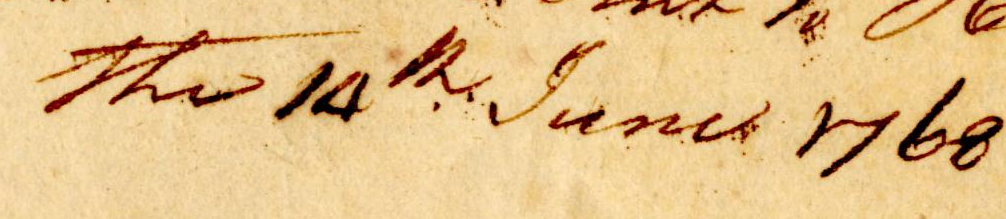The 14^th June 1768
